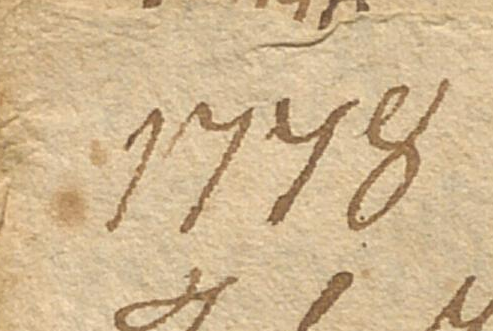1778
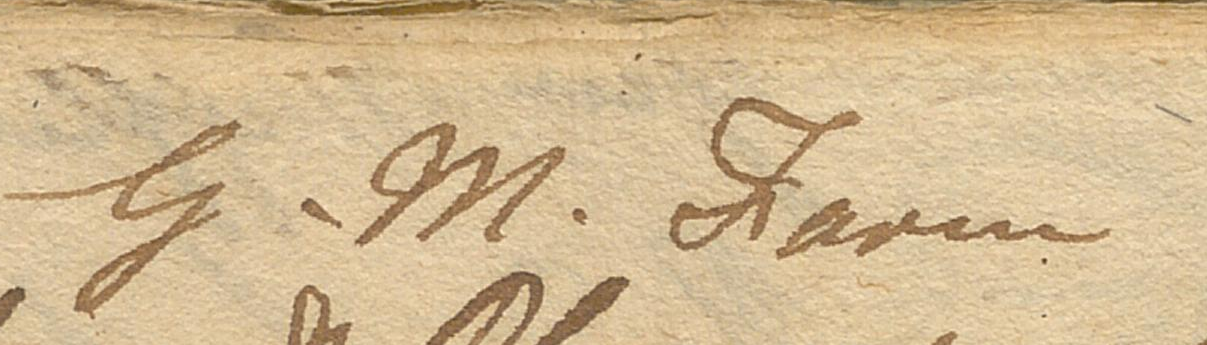G. M. Farm
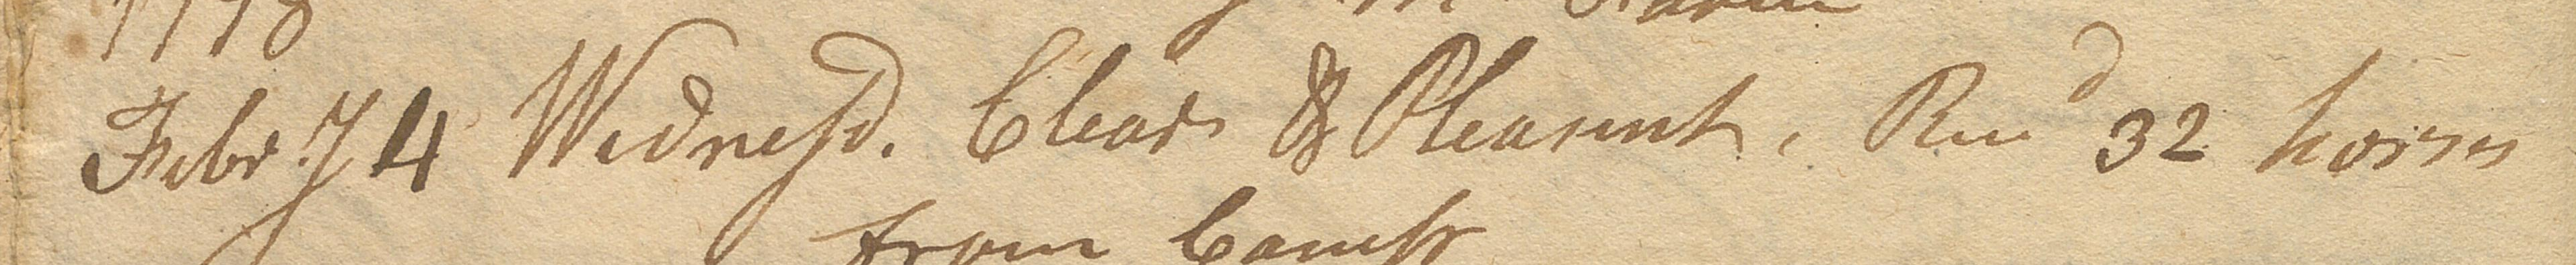Febr^y. 4 Wedness. Clear & Pleasent. Rec^d 32 horses
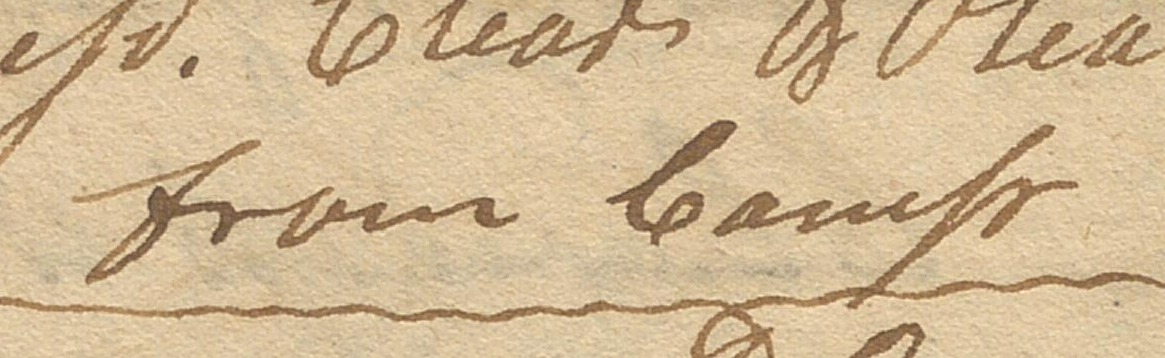from Camp
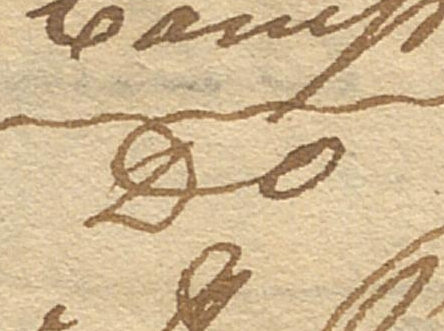Do
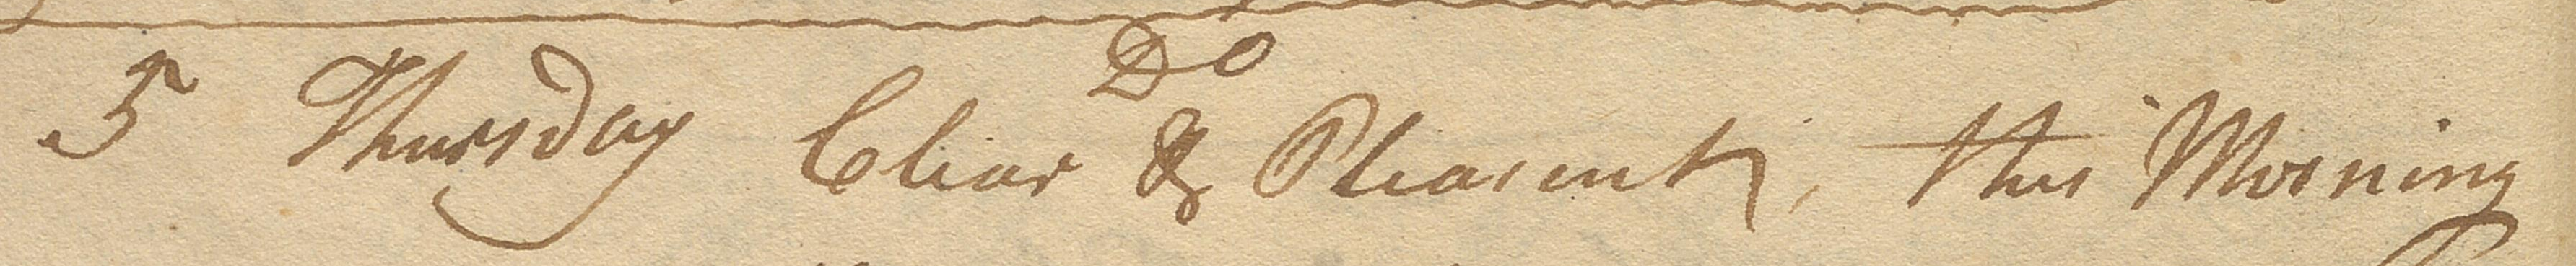5 Thursday Clear & Pleasent, this Morning
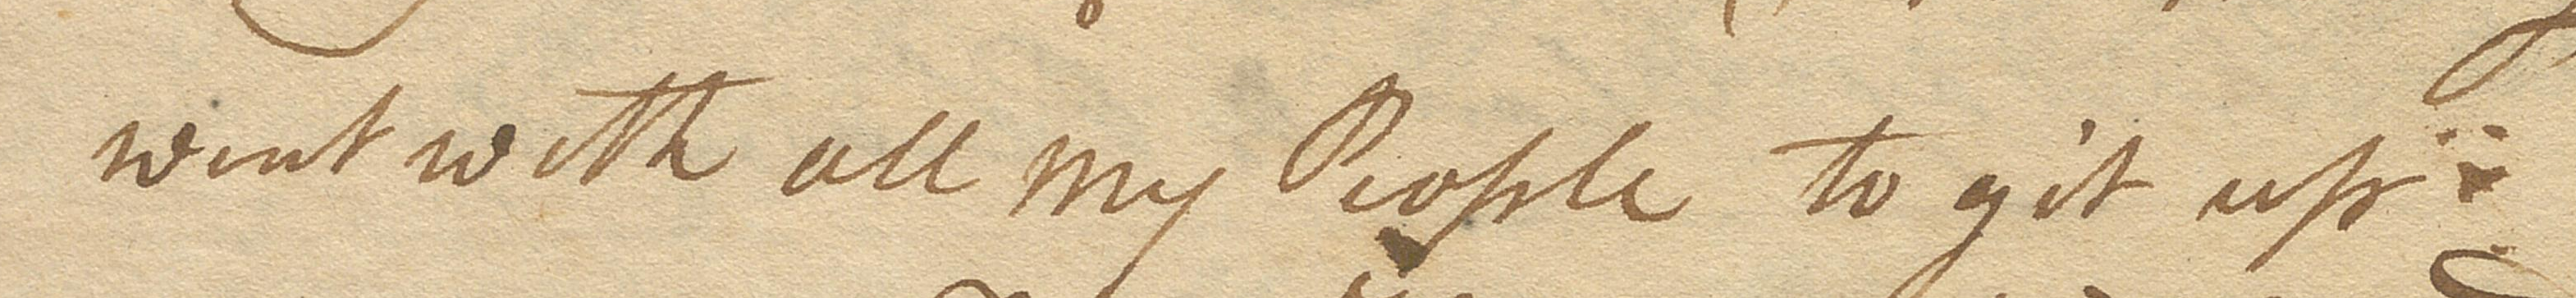went with all my People to git up
